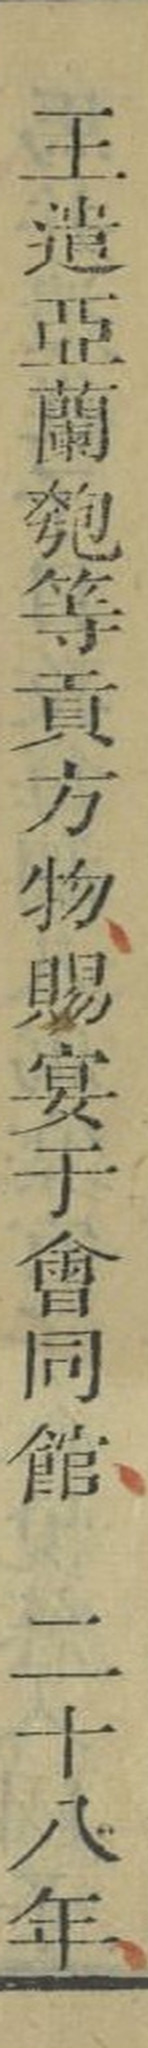王遣亜蘭匏等貢方物賜宴于会同館二十八年
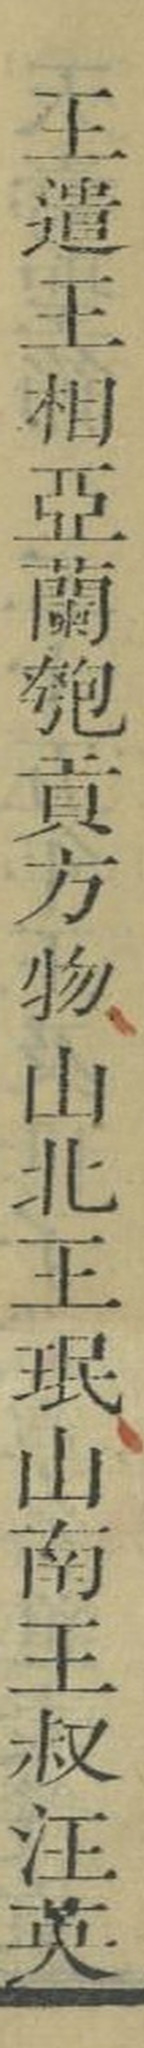王遣王相亜蘭匏貢方物山北王珉山南王叔汪英
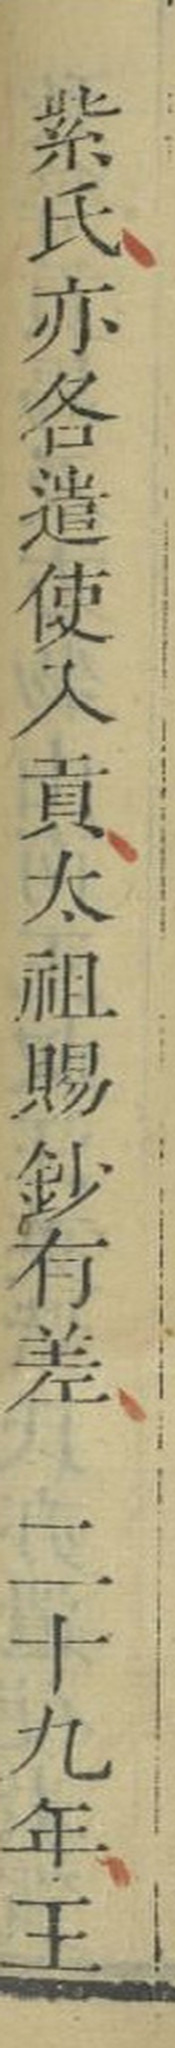紫氏亦各遣使入貢太祖賜鈔有差二十九年王
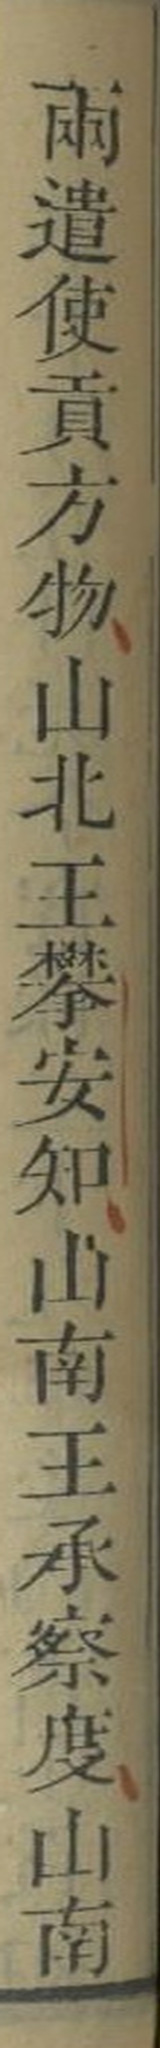両遣使貢方物山北王攀安知山南王承察度山南
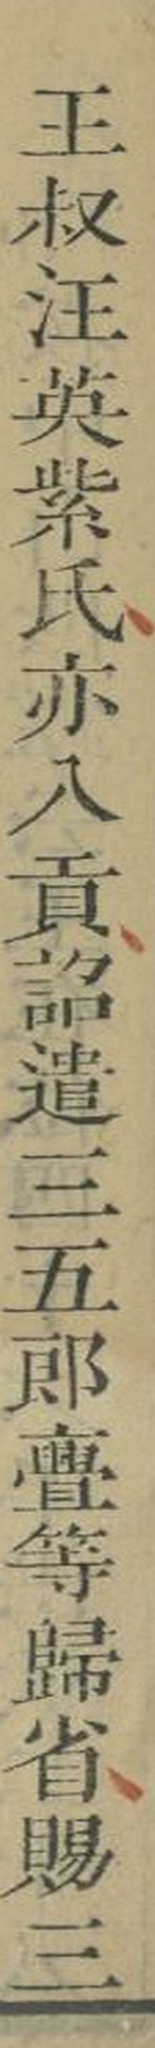王叔汪英紫氏亦入貢詔遣三五郎亹等帰省賜三
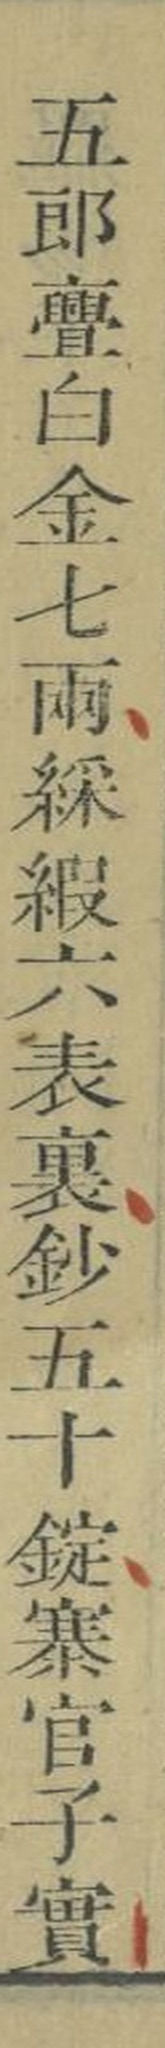五郎亹白金七両綵緞表裏鈔五十錠寨官子実
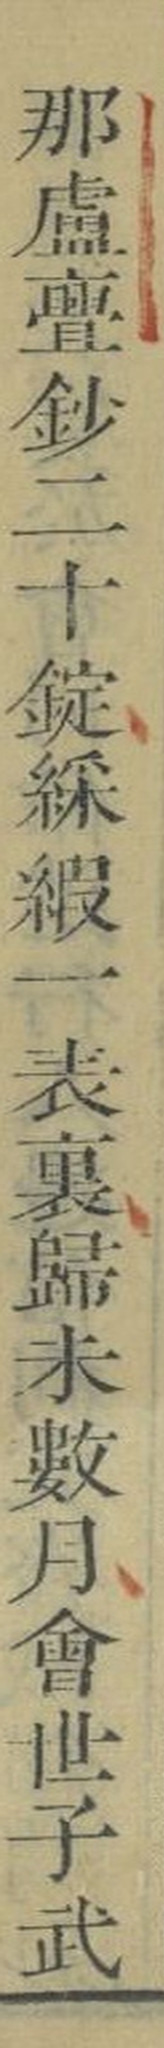那盧亹鈔二十錠綵緞一表裏帰未数月会世子武
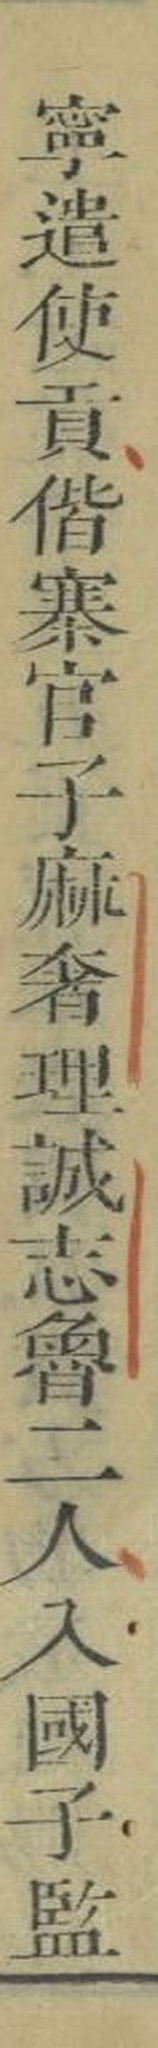寧遣使貢偕寨官子麻奢理誠志魯二人入国子監
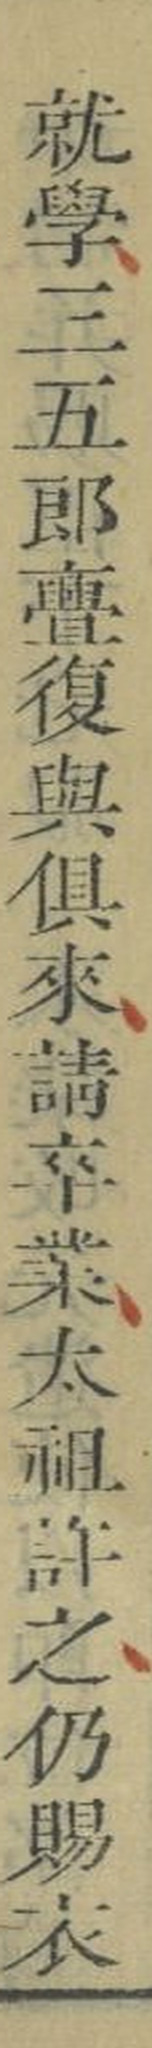就学三五郎亹復与俱来請卒業太祖許之仍賜衣
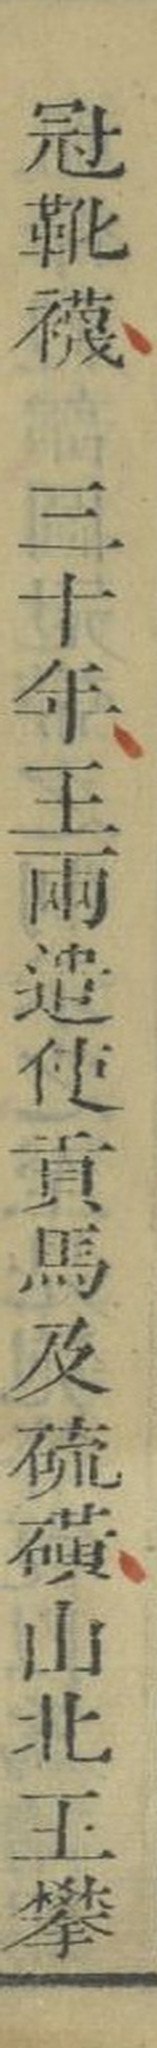冠靴襪三十年王両遣使貢馬及硫磺山北王攀
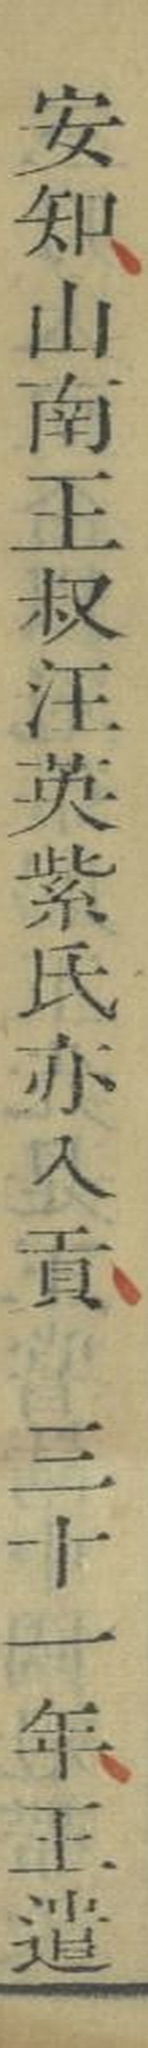安知山南王叔汪英紫氏亦入貢三十一年王遣
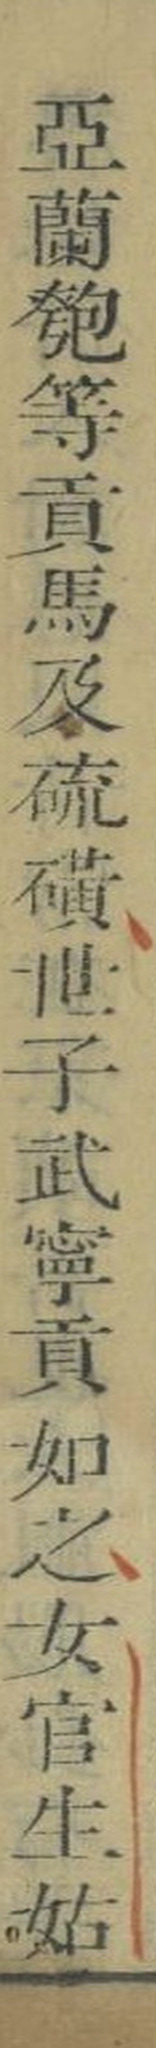亜蘭匏等貢馬及硫磺世子武寧貢如之女官生姑

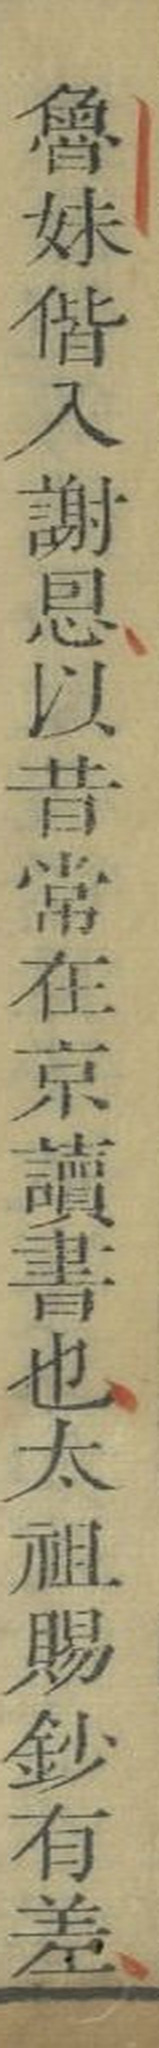魯妹偕入謝恩以昔常在京読書也太祖賜鈔有差
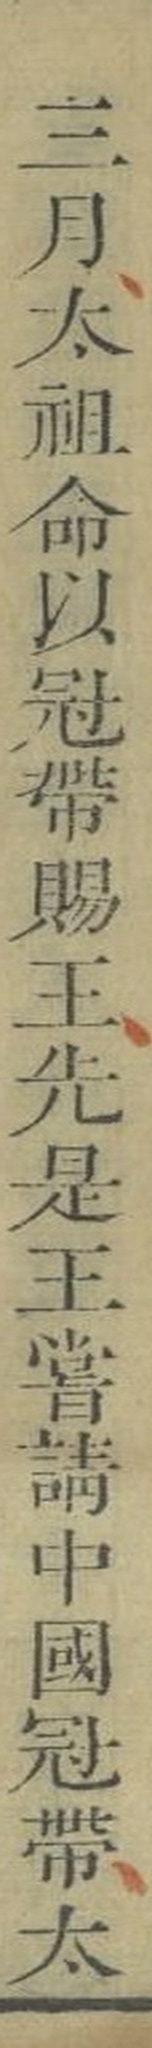三月太祖命以冠帯賜王先是王嘗請中国冠帯太
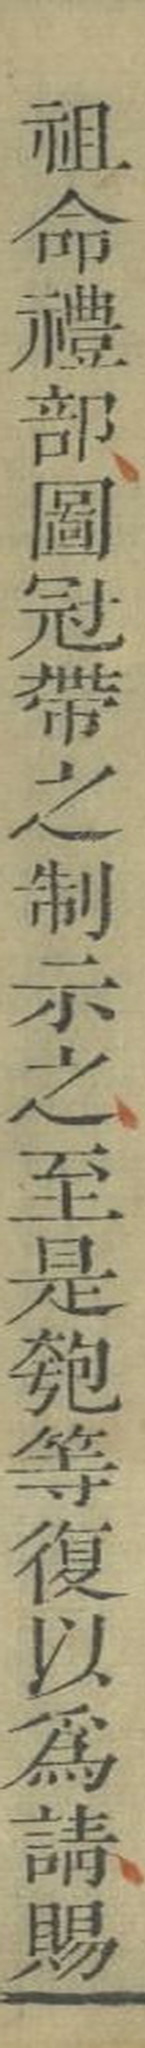祖命礼部図冠帯之制示之至是匏等復以為請賜
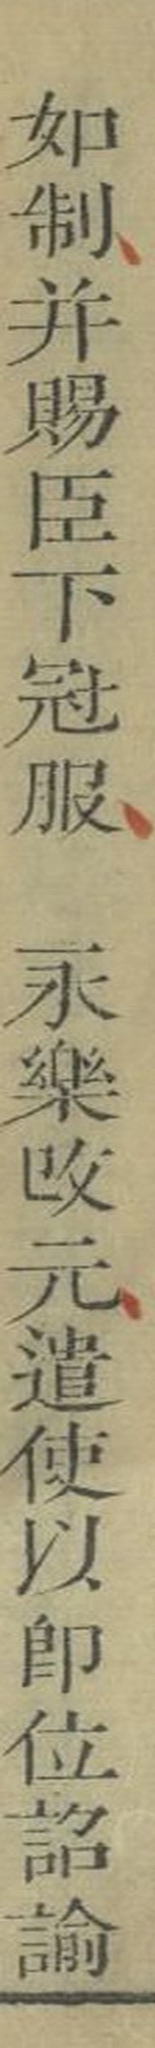如制并賜臣下冠服永楽改元遣使以即位詔諭
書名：中山伝信録 巻三
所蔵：University of the Ryukyus Library
